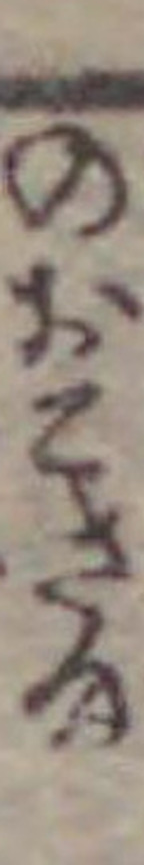のおこさま
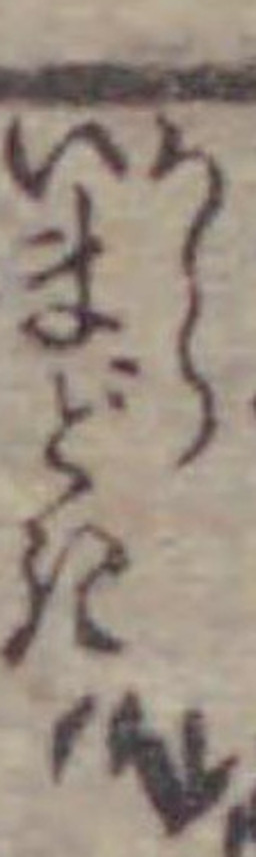いまどき
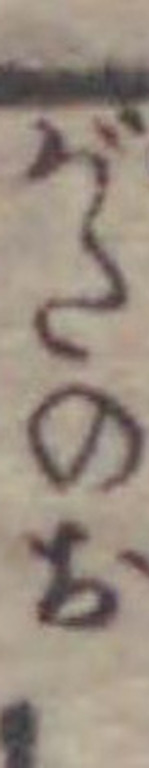がたのお
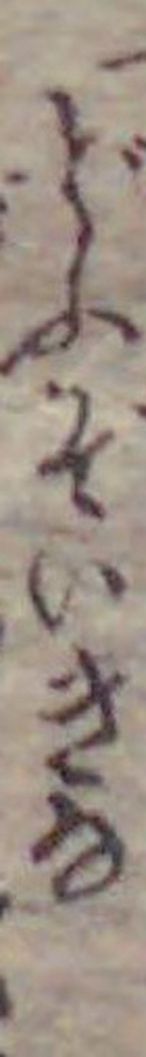〽どふぞいきな
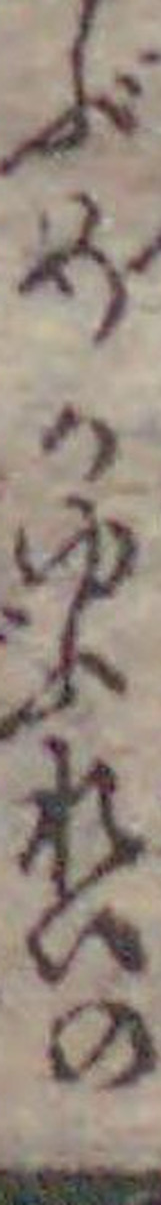うぶめかゆふれいの
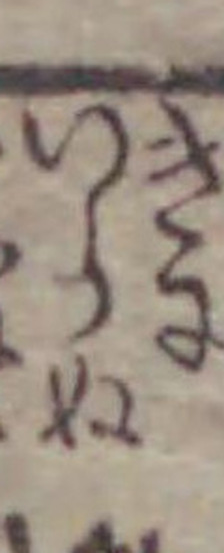いらぬ
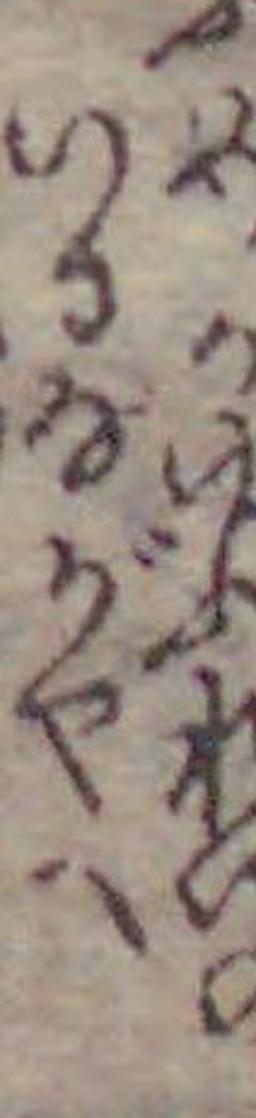いるながやへ
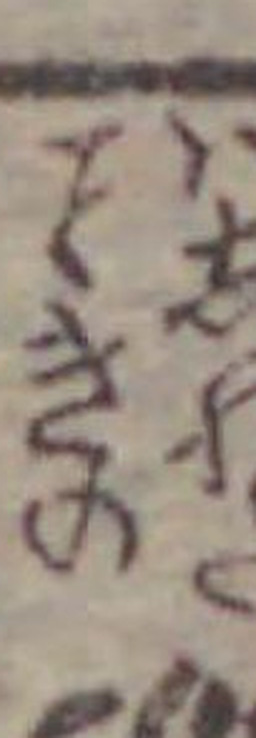こときの
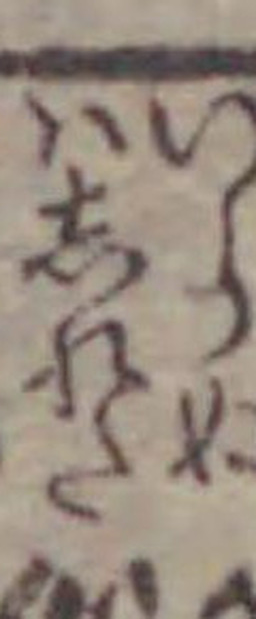はしれた
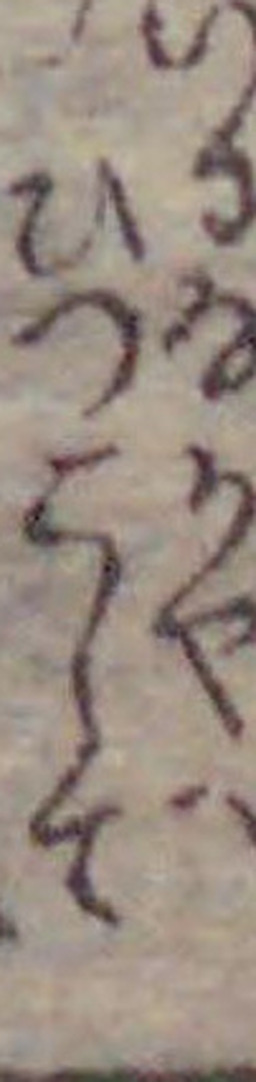ひつこして
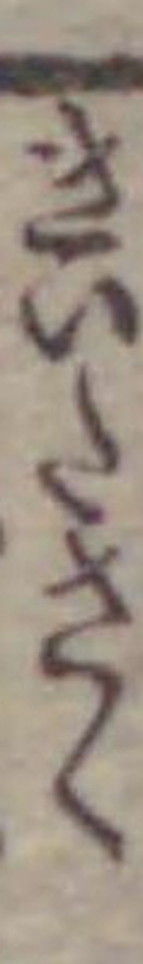きいたさく
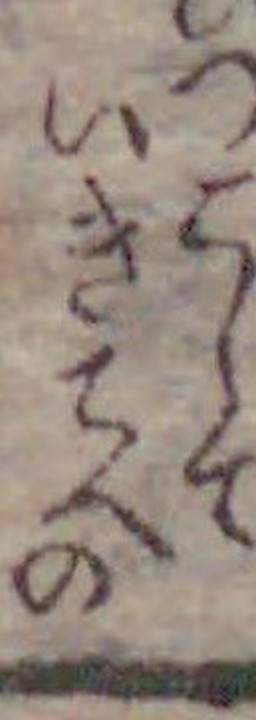いきてへの
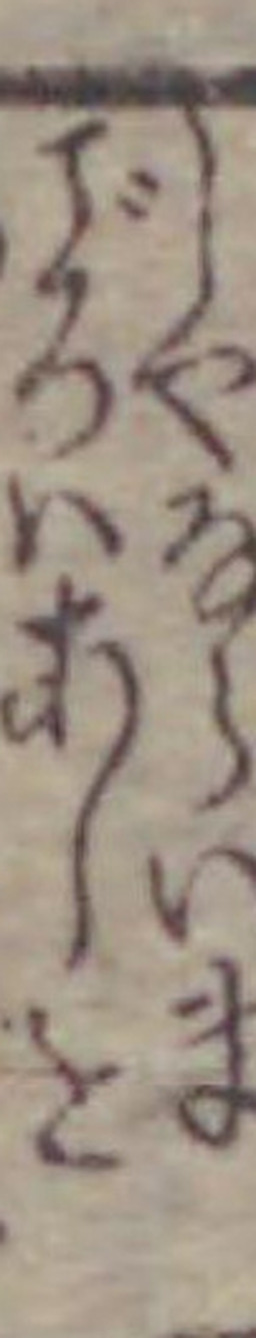ごろはあしを
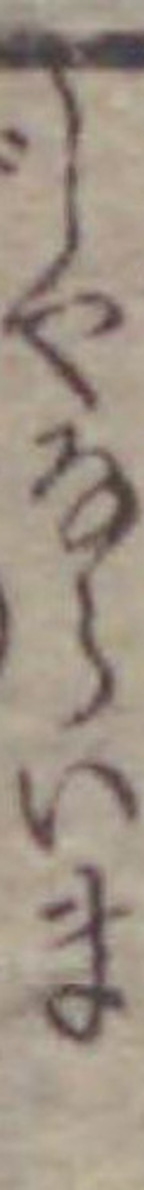しやならいま
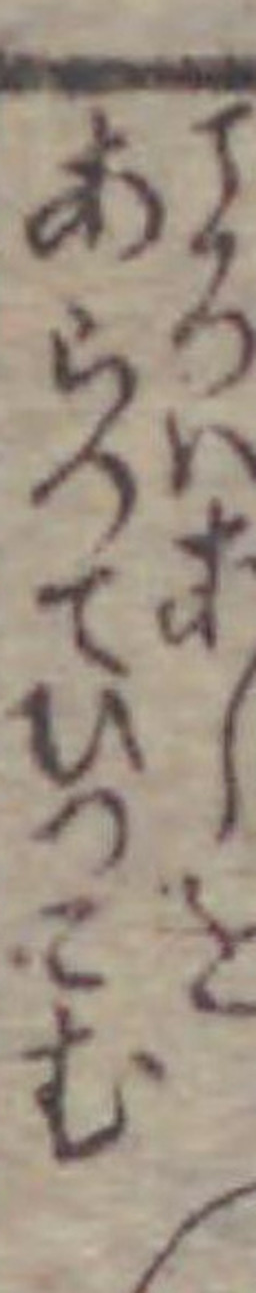あらつてひつこむ
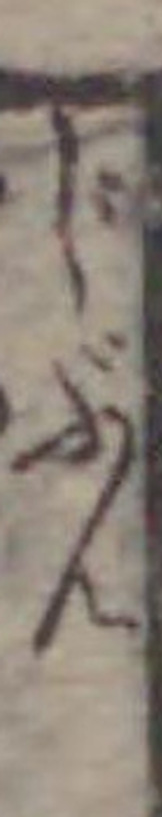じぶん
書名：化物見世開 : 2巻
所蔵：国立国会図書館 National Diet Library, JAPAN
